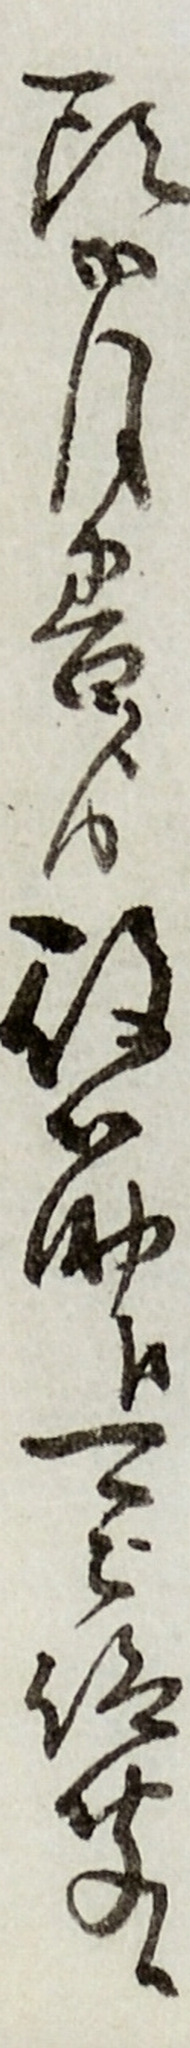頭御月番ゟ役筋江可被仰聞候
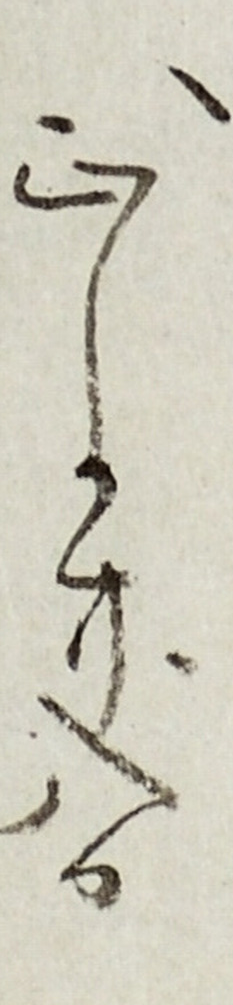正月廿八日
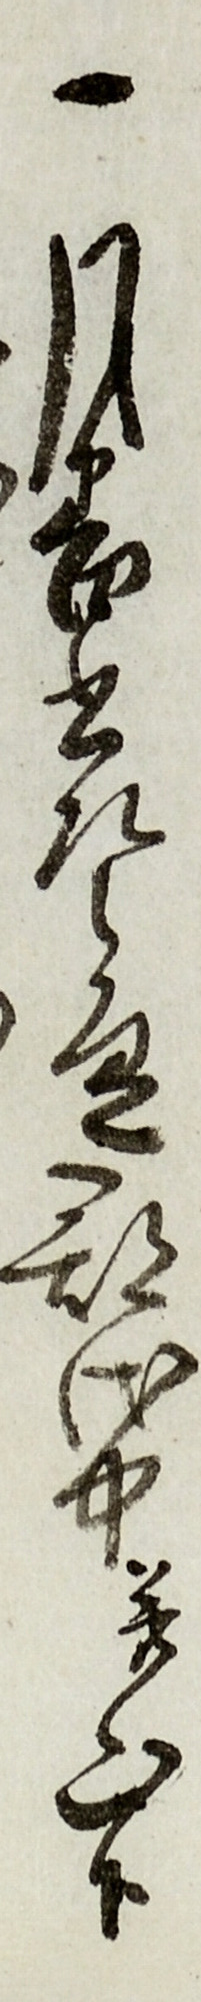一月番書左之通郡代中并山下
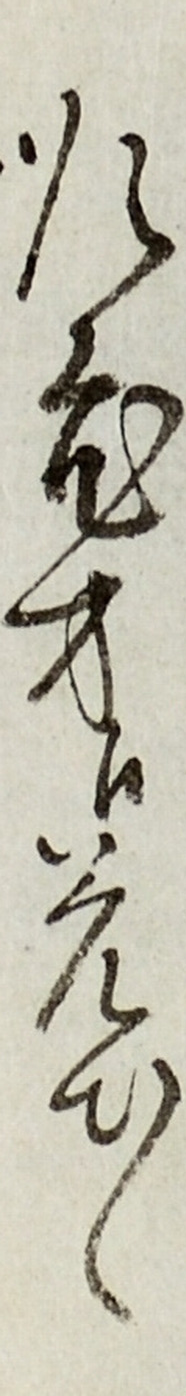順蔵方江差出候
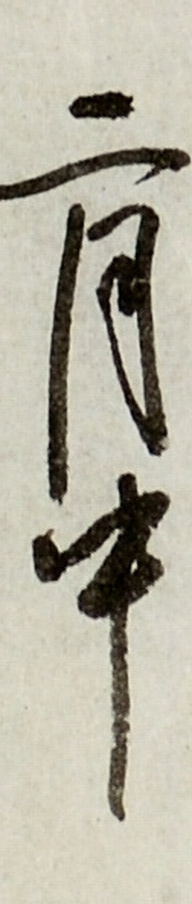二月中
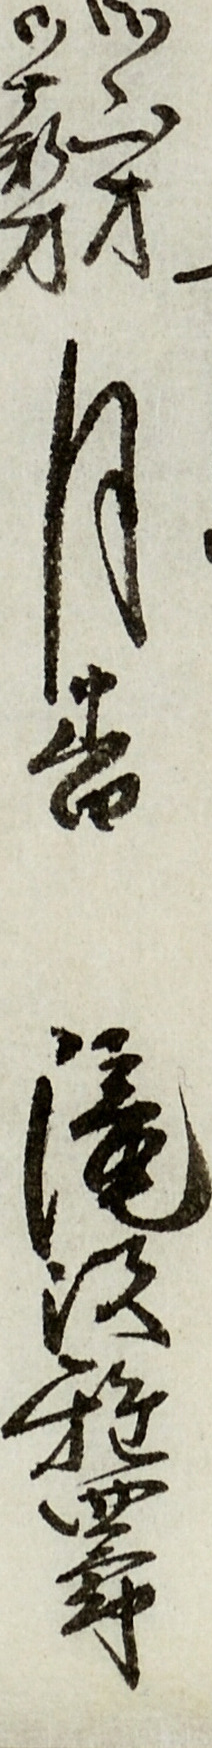御薪方月番滝沢雅四郎

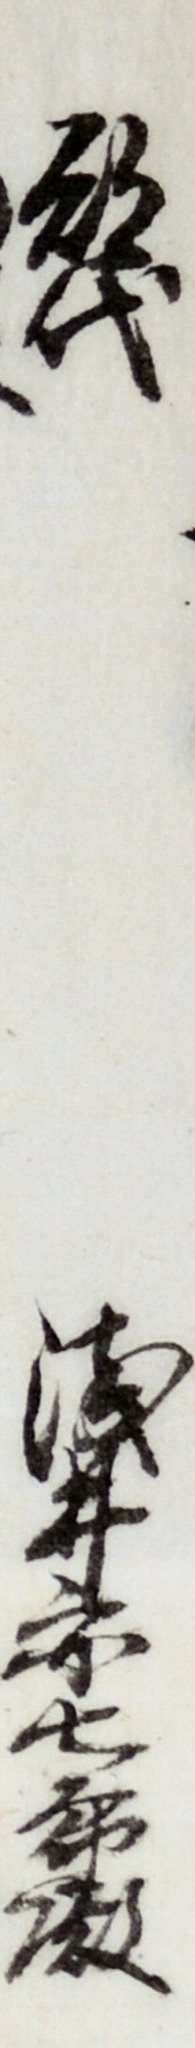郡代浅井亦七郎殿
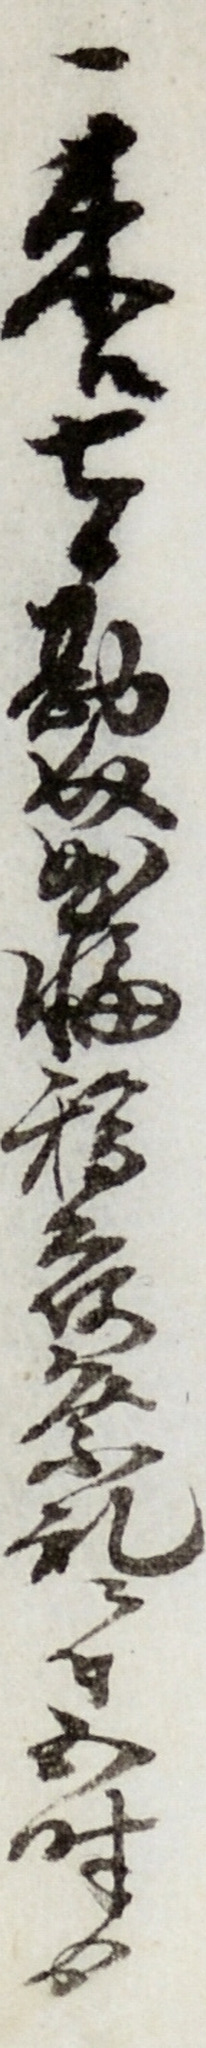一来ル七日勘介曲輪稲荷祭礼ニ付五時ゟ
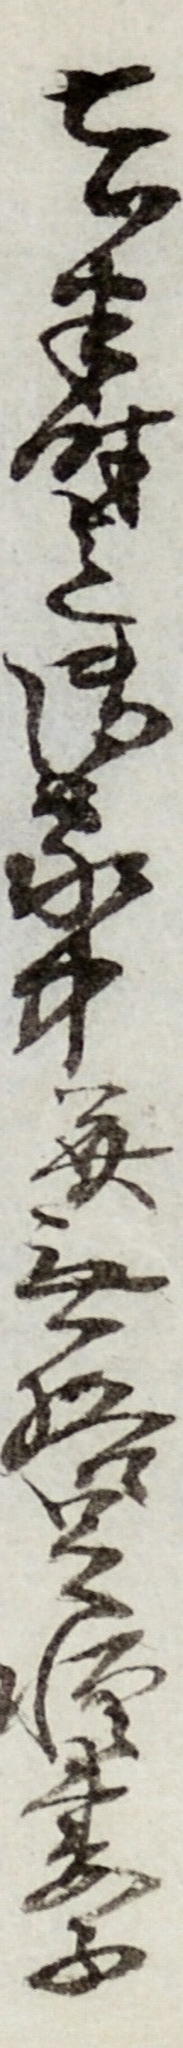七ツ半時迄御家中并無格足軽妻子
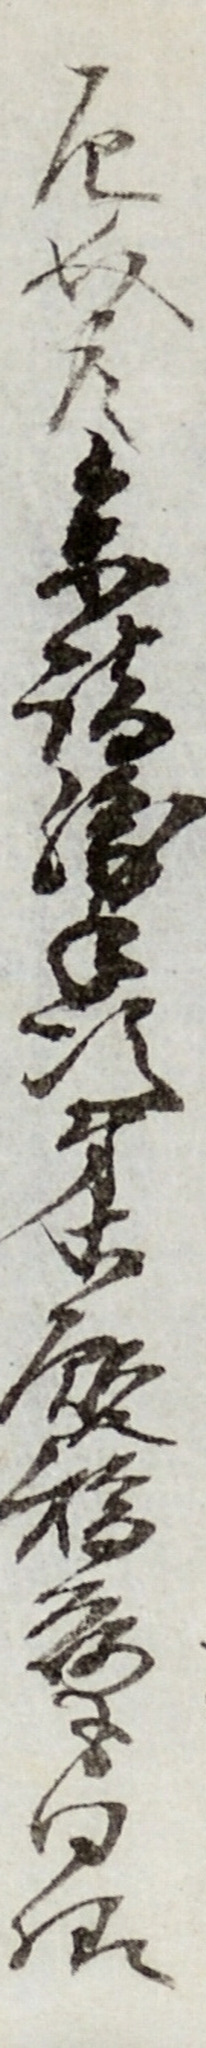厄介共参詣勝手次第御厩稲荷も同様
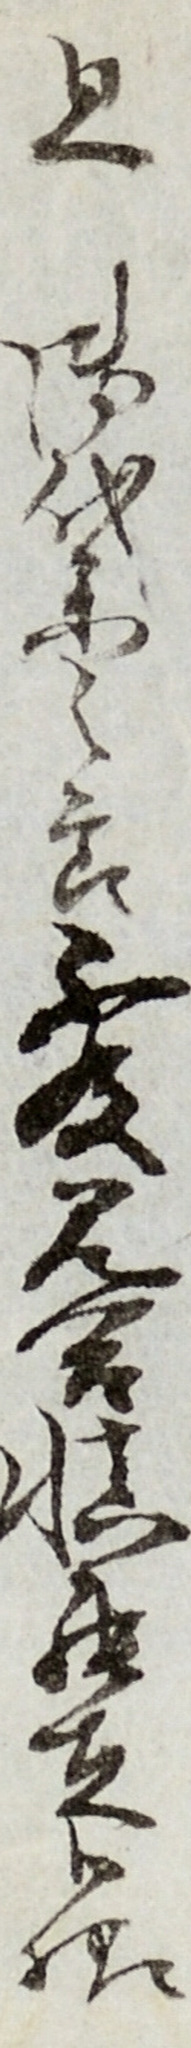且御代参之節不及見合慎罷在候様
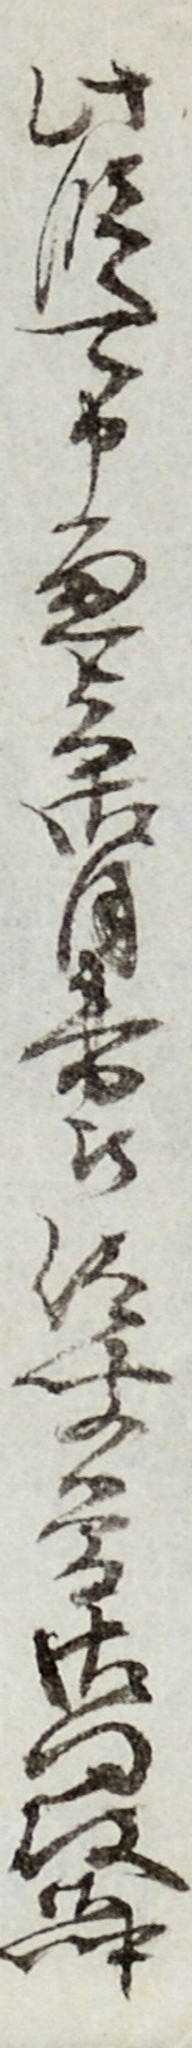此段可申通旨御月番被仰聞候間御同役御仲
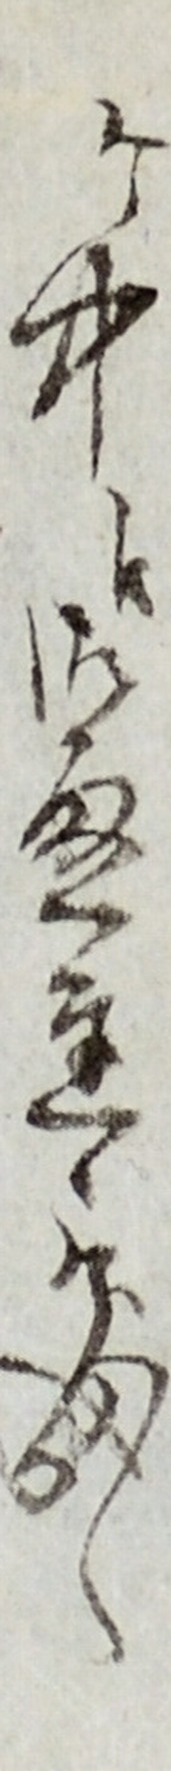ケ中江御通達被成候
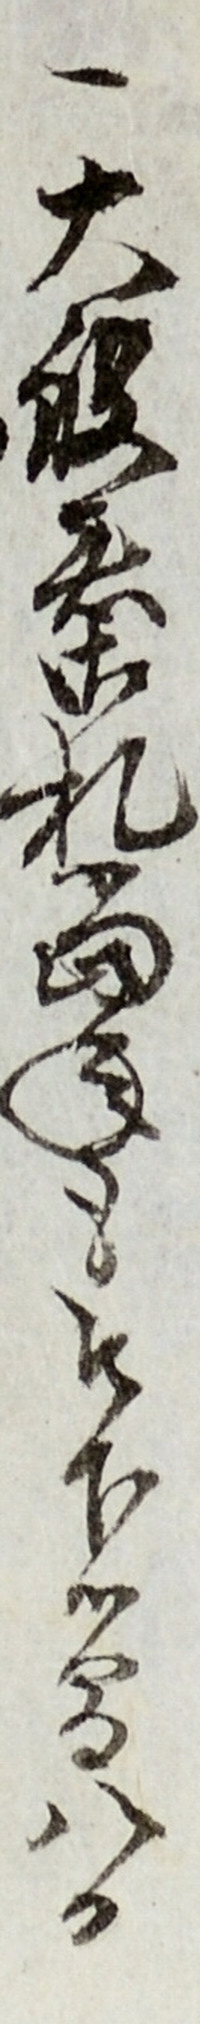一大般若御礼当年も被下候間八日
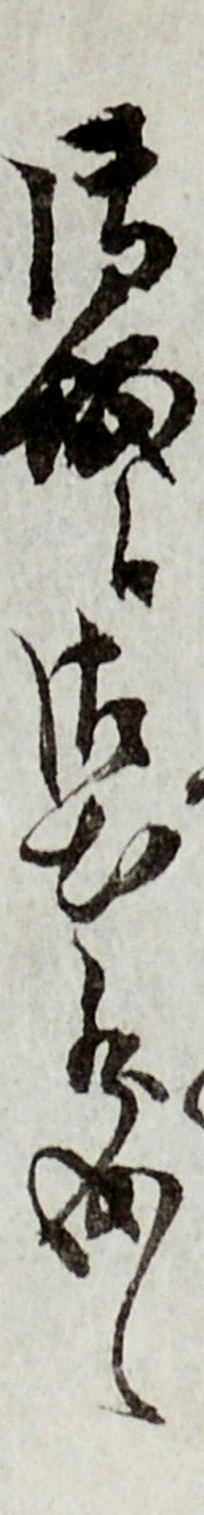御城江御出可被成候
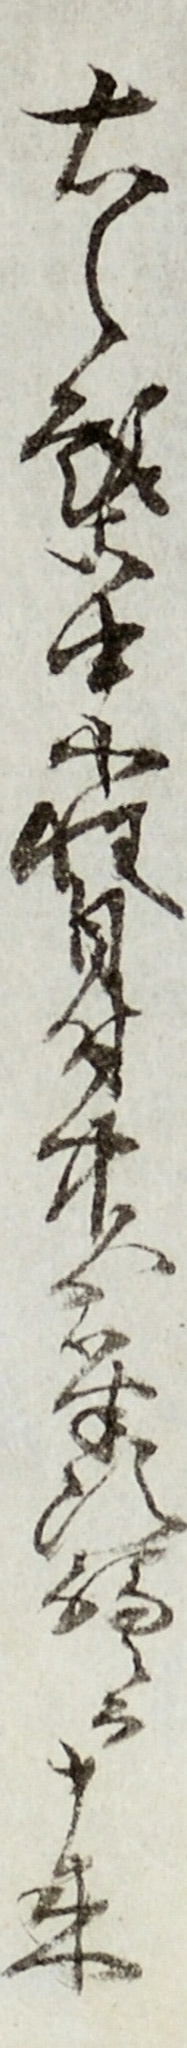右之義御中小性目付中ゟ筆頭触ニ而申来
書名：御山方御薪方諸事御用留
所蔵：伊那市立高遠町図書館・合同会社AMANE
